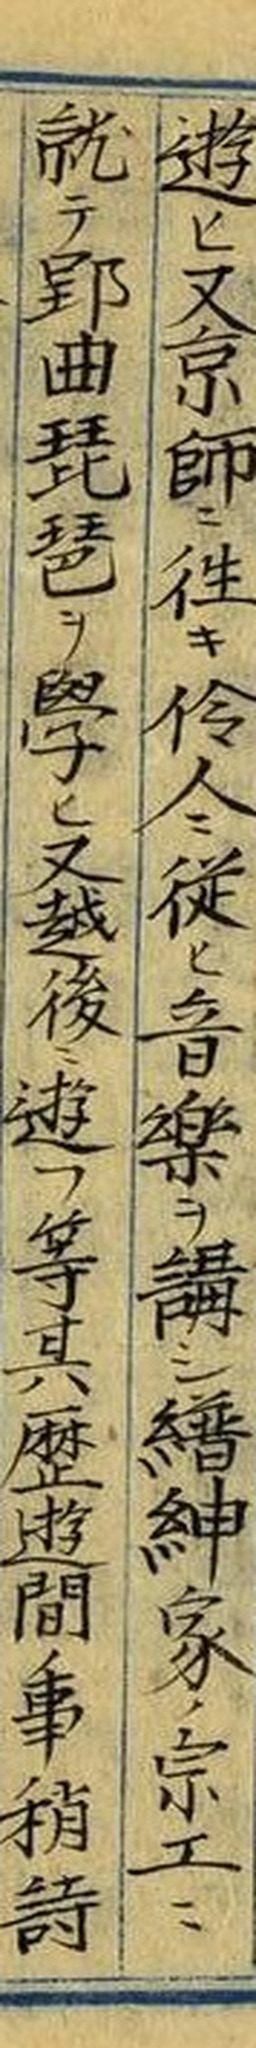就テ郢曲琵琶ヲ學ヒ又越後ニ遊フ等其歴遊間ノ事稍詩
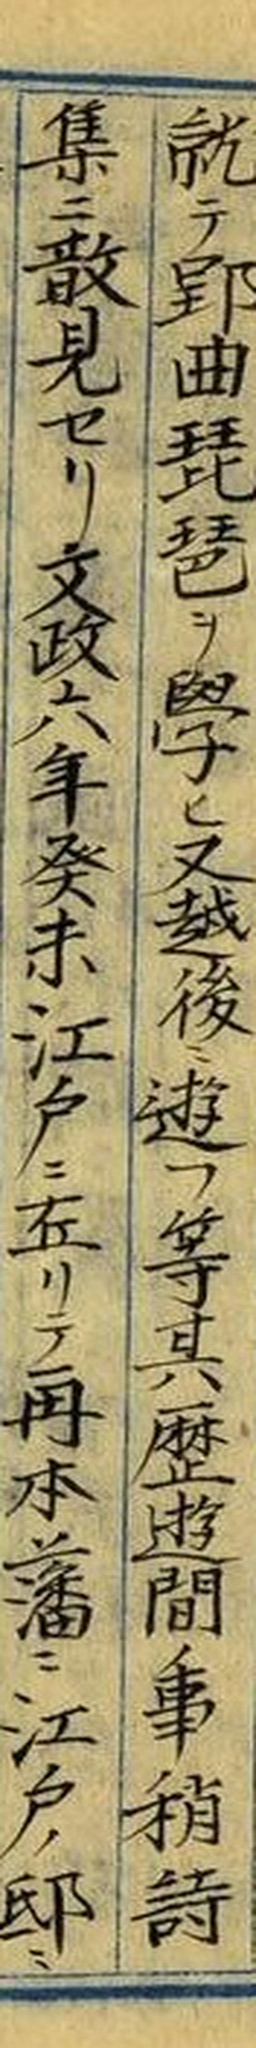集ニ散見セリ文政六年癸未江戸ニ在リテ再本藩ニ江戸ノ邸ニ
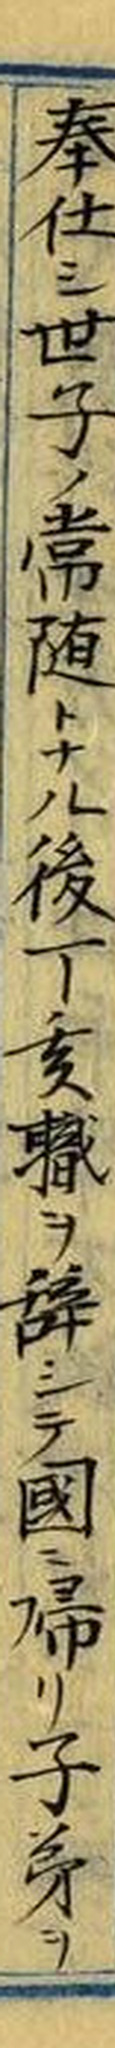奉仕シ世子ノ常随トナル後丁亥職ヲ辞シテ國ニ帰リ子弟ヲ
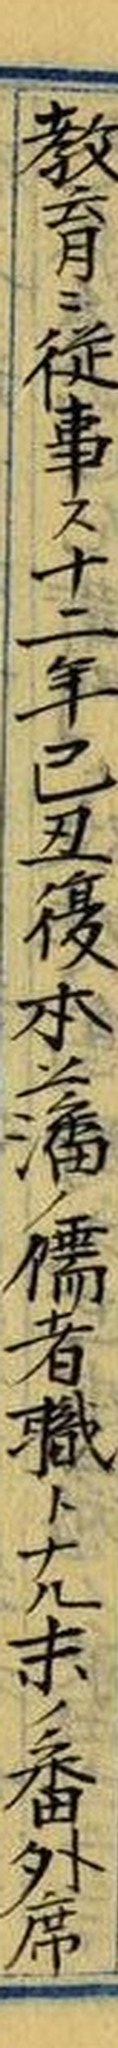教育ニ従事ス十二年己丑復本藩ノ儒者職トナル末ノ番外席
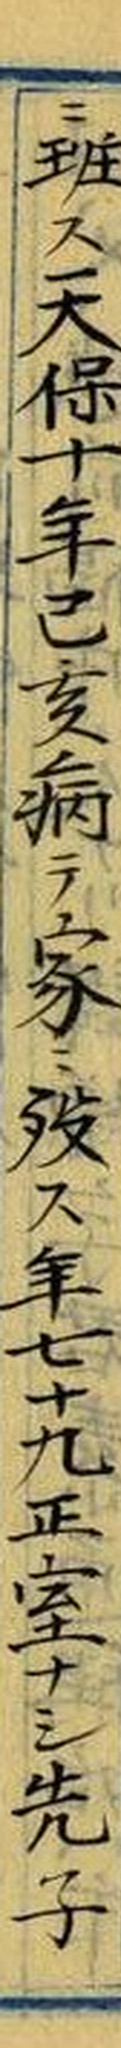ニ班ス天保十年己亥病テ家ニ歿ス年七十九正室ナシ先子
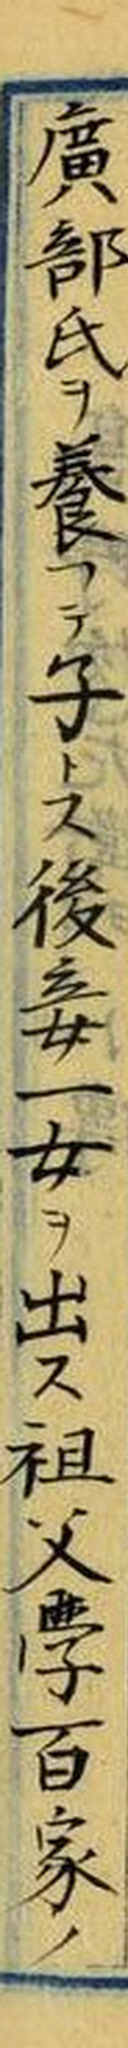廣部氏ヲ養フテ子トス後妾一女ヲ出ス祖父學百家ノ
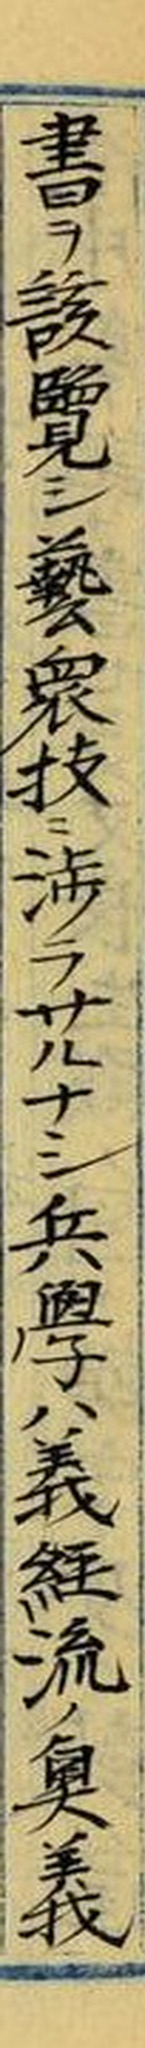書ヲ該覽シ藝衆技ニ渉ラサルナシ兵學ハ義經流ノ奥義
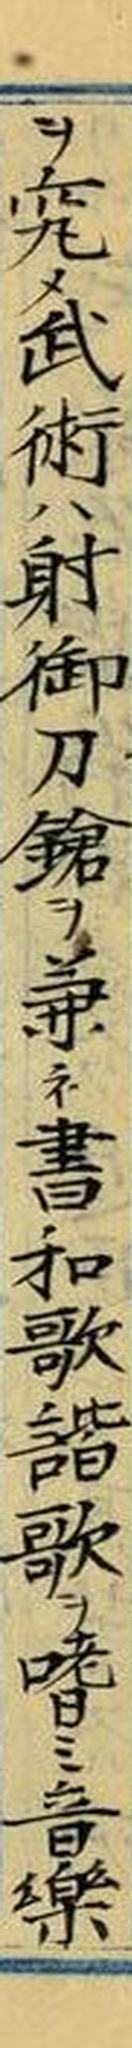ヲ究メ武術ハ射御刀鎗ヲ兼ネ書和歌諧歌ヲ嗜ミ音樂
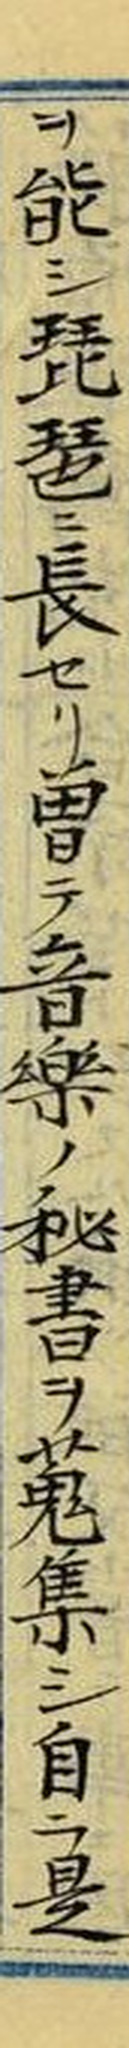ヲ能シ琵琶ニ長セリ曽テ音樂ノ秘書ヲ蒐集シ自ラ是
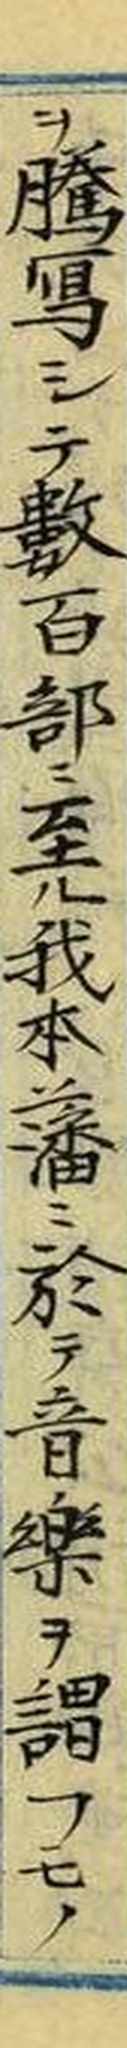ヲ謄冩シテ數百部ニ至ル我本藩ニ於テ音樂ヲ謂フモノ
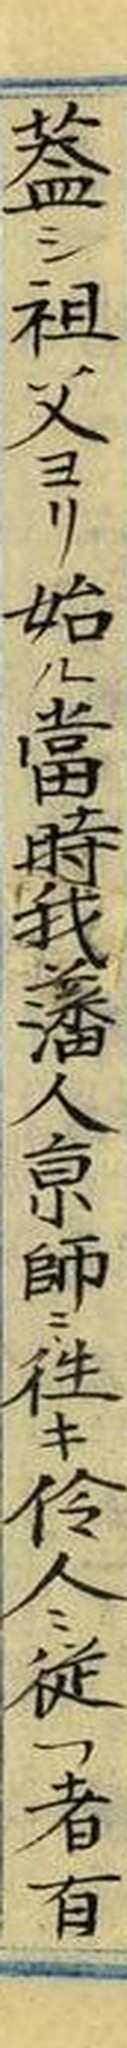葢シ祖父ヨリ始ル當時我藩人亰師ニ往キ伶人ニ従フ者有
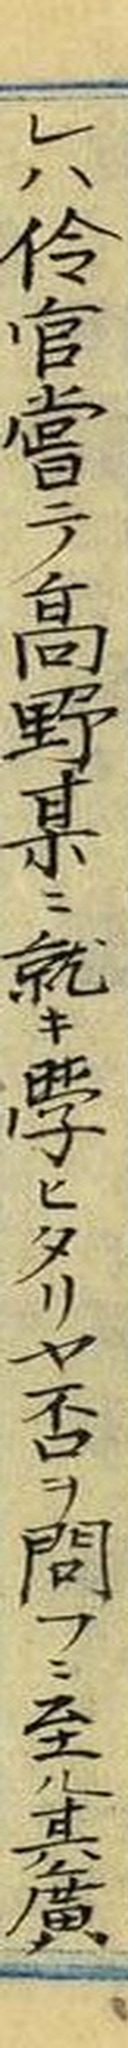レハ伶官嘗テ高野某ニ就キ學ヒタリヤ否ヲ問フニ至ル其廣
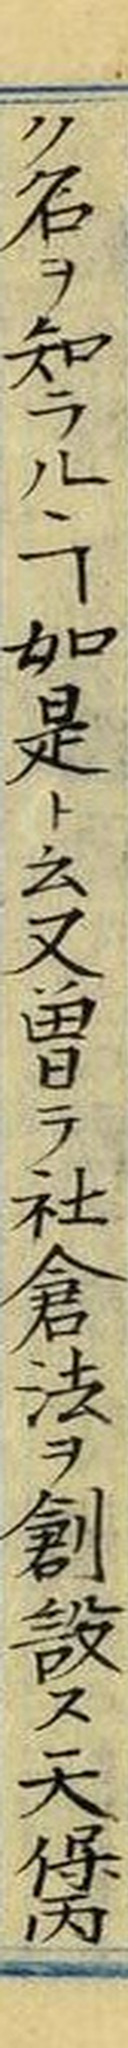ク名ヲ知ラルヽヿ如是ト云又曽テ社倉法ヲ創設ス天保丙
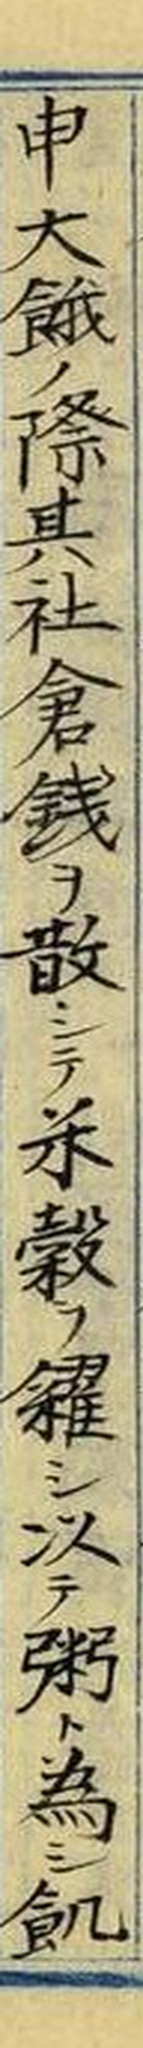申大餓ノ際其社倉銭ヲ散シテ米穀ヲ糴シ以テ粥ト為シ飢
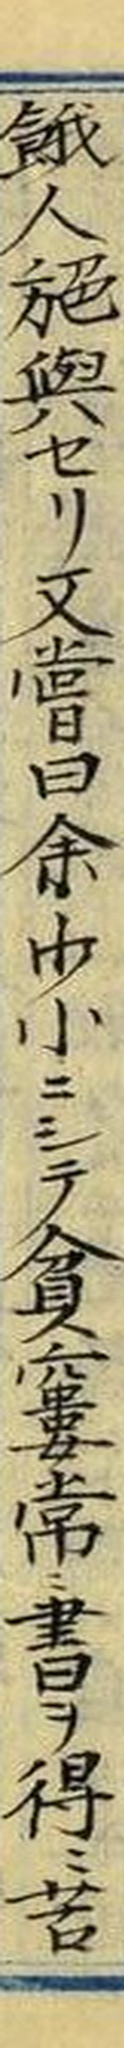餓人施與セリ又嘗曰余少小ニシテ貧窶常ニ書ヲ得ニ苦
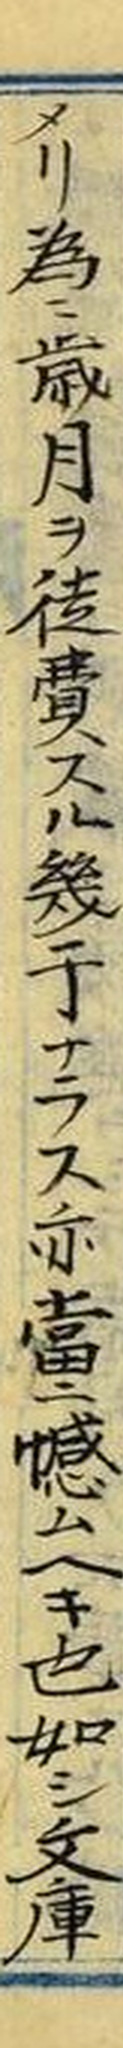メリ為ニ歳月ヲ徒費スル幾干ナラス亦當ニ憾ムヘキ也如シ文庫
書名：温古集 四巻
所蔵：福井県文書館 Fukui Prefectural Archives
